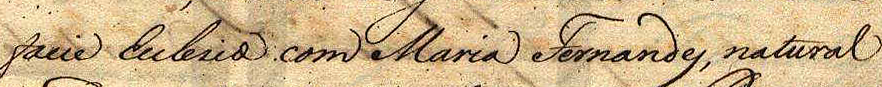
facie Eccleziæ com Maria Fernandes, natural
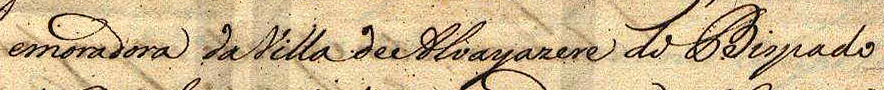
e moradora da Villa de Alvayazere do Bispado
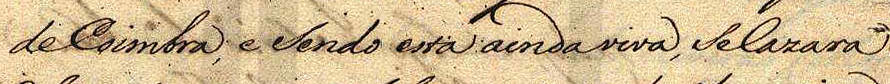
de Coimbra, e sendo esta ainda viva, Se Cazara
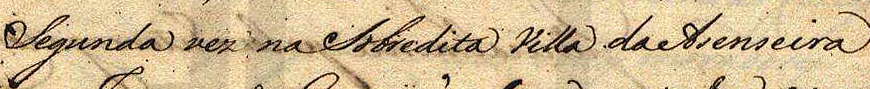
Segunda vez na Sobredita Villa da Asenseira
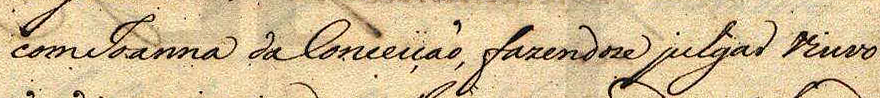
com Ioanna da Conceiçaõ, fazendose julgar viuvo
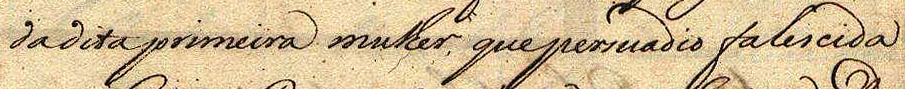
da dita primeira mulher, que persuadio falescida
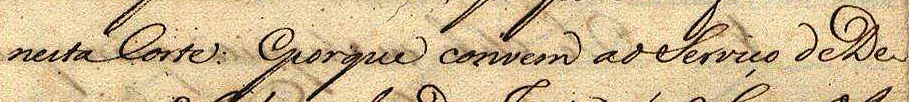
nesta Corte: E porque convem ao Serviço de De
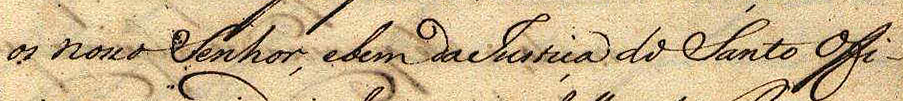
os nosso Senhor, e bem da Iustiça do Santo Offi
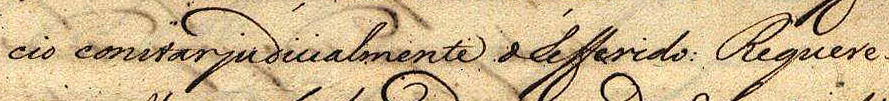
cio constar judicialmente o Refferido: Requere
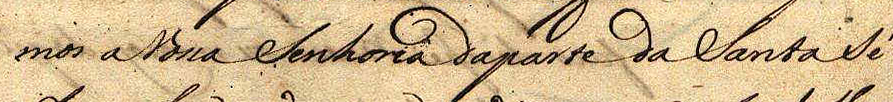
mos a Vossa Senhoria da parte da Santa Sé
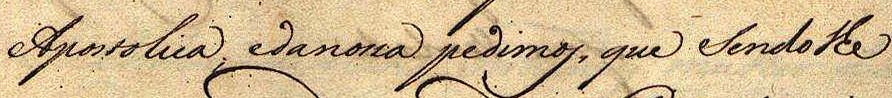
Apostolica, e da nossa pedimos, que sendolhe
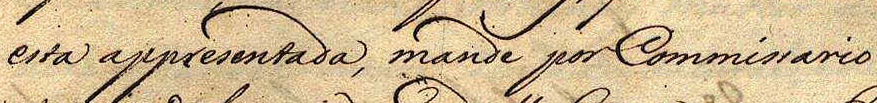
esta appresentada, mande por Commissario
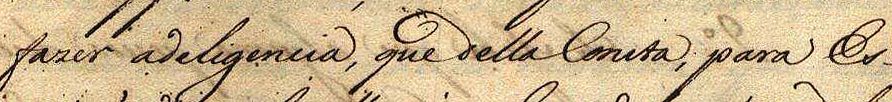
fazer a deligencia, que della Consta, para Es
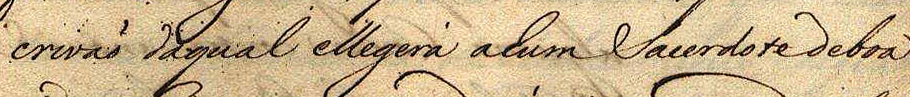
crivaõ da qual ellegera a hum Sacerdote de boa
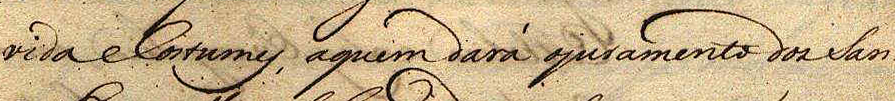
vida e Costumes, a quem dará o juramento dos San
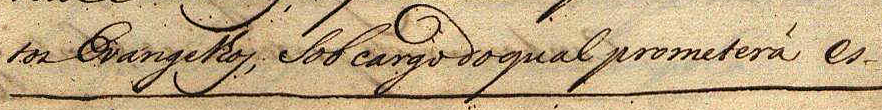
toz Evangelhos, sob cargo do qual prometerá es
